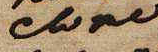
e come
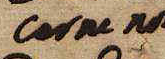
carne nos
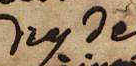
dias de
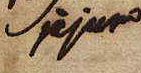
jejum
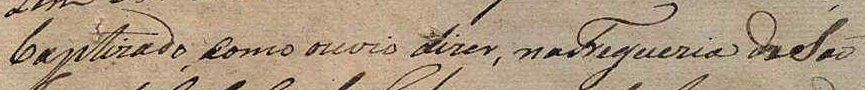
baptizado como ouvio dizer, na Freguezia de Saõ
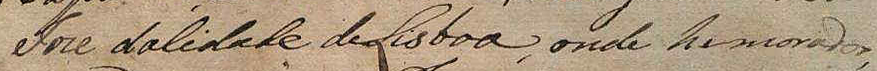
Ioze da Cidade de Lisboa onde he morador,
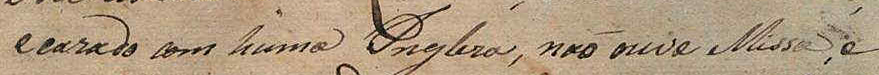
e cazado com huma Ingleza, naõ ouve Missa, e
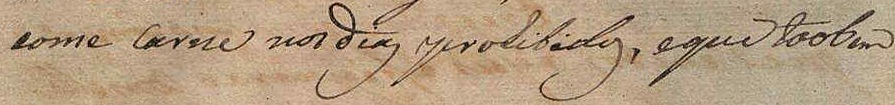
come carue nos dias prohibidos, e que taobem
